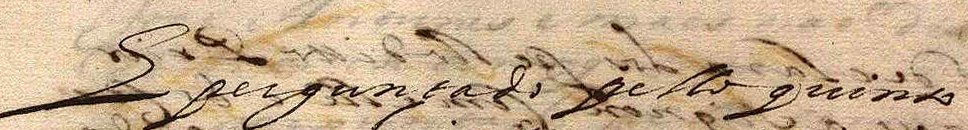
E perguntado pello quinto
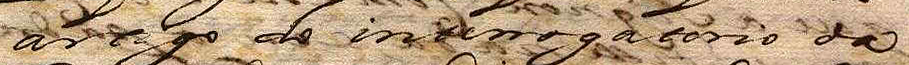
artigo do interrogatorio da
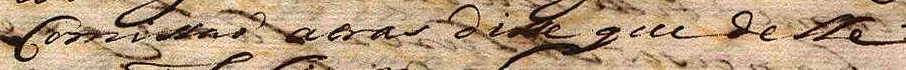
Comissaõ atras disse que deste
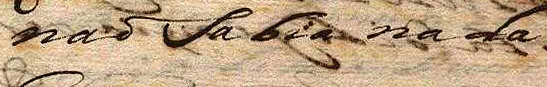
não sabia nada.
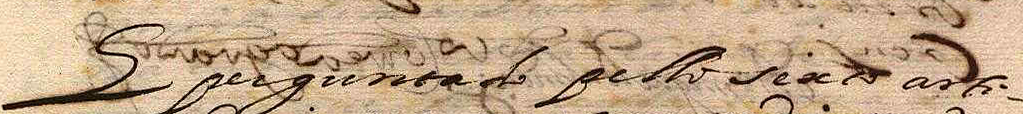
E perguntado pello sexto arti
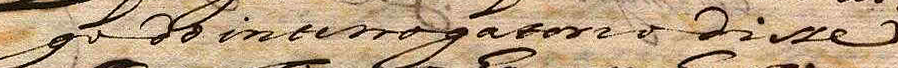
go do interrogatorio disse
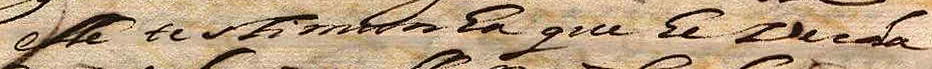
elle testimunha que he verda
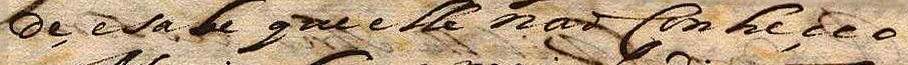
de, e sabe que elle naõ Conheceo
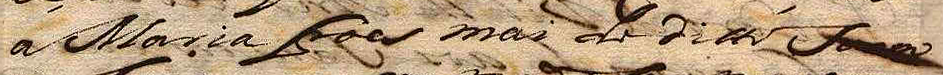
a Maria froes mai do ditto Ioam
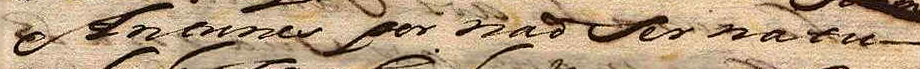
Antunes por naõ Ser natu
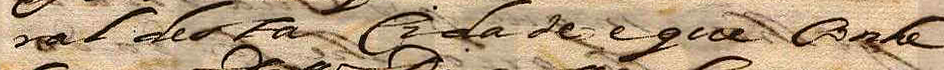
ral desta Cidade e que conhe
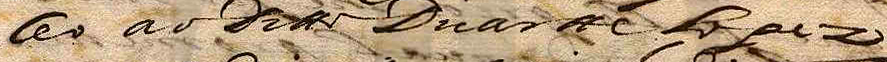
ceo ao Ditto Duartte lopez
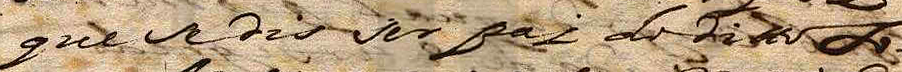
que se dis ser pai do ditto Io
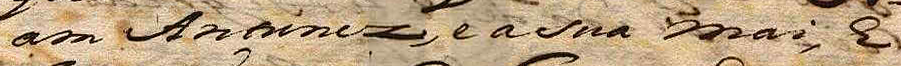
am Antunez, e a sua mai, E
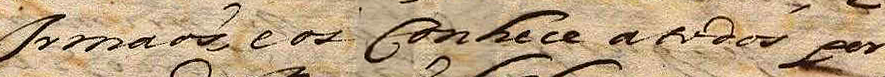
Jrmaõs, e os Conhece a todos por
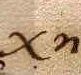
xn
